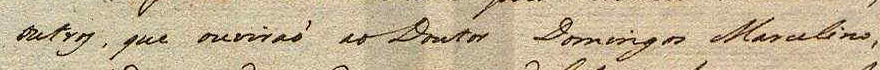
outros, que ouviraõ ao Doutor Domingos Marcelino,
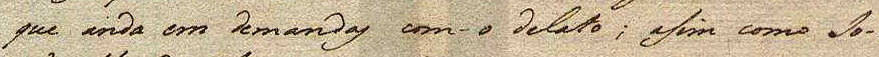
que anda em demandas com o delato; asim como Io
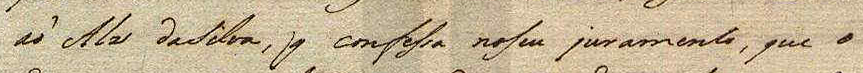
aõ Alz da Silva, q̄ confessa no seu juramento, que o
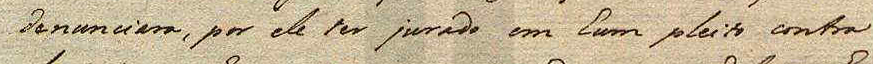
denunciara, por ele ter jurado em hum pleito contra
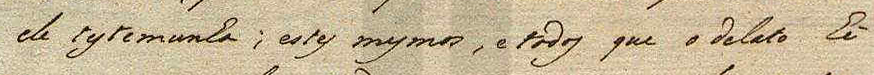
ele testemunha; estes mesmos, e todos que o delato hé
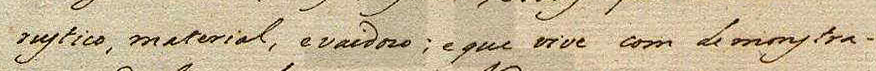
rustico, material, e vaidozo; e que vive com demonstra
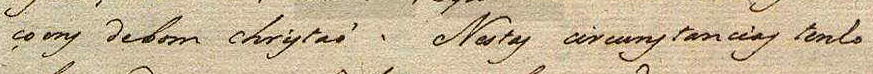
çoens de bom christaõ. Nestas circunstancias tenho
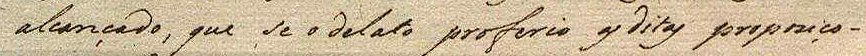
alcançado, que se o delato proferio as ditas propoziço
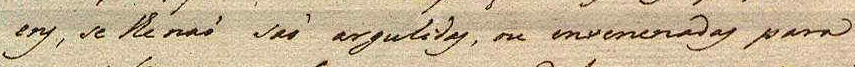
ens, se lhe naõ saõ argulidas, ou envenenadas para
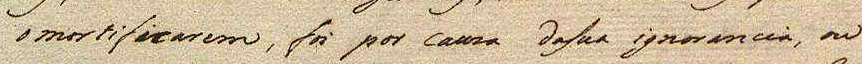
o mortificarem, foi por cauza da sua ignorancia, ou
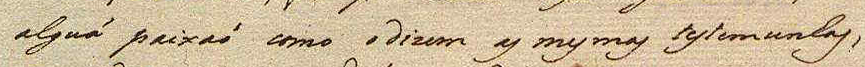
alguā paixaõ como o dizem as mesmas testemunhas,
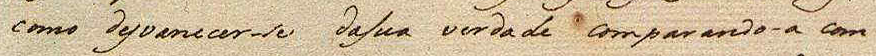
como desvanecer-se da sua verdade comparando-a com
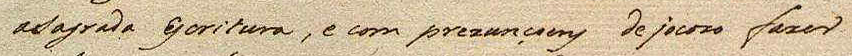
a Sagrada Escritura, e com prezunçoens de jocozo fazer
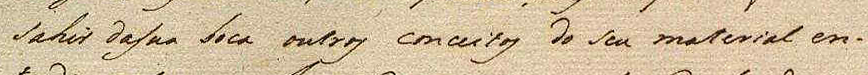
sahir da sua boca outros conceitos do seu material en
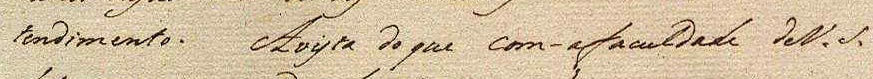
tendimento. A vista do que com-a faculdade de V. S.
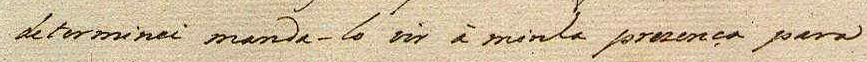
determinei manda-lo vir á minha prezença para
